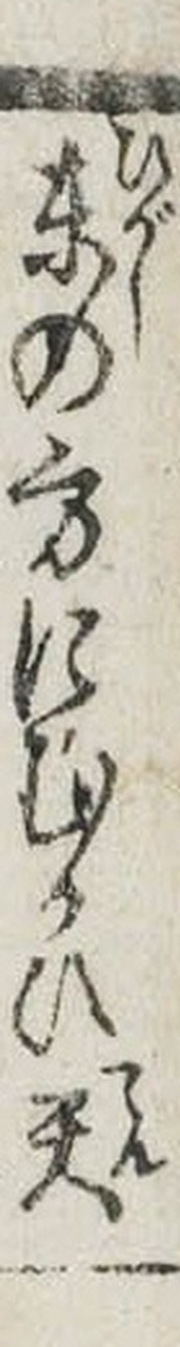東の方にむかひ天
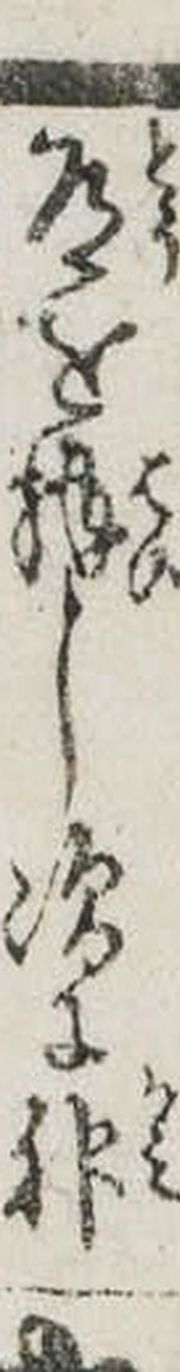道を拝し次に神
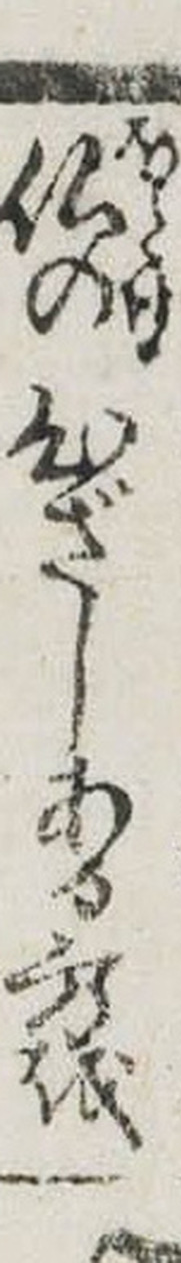仏の心ざしある方を
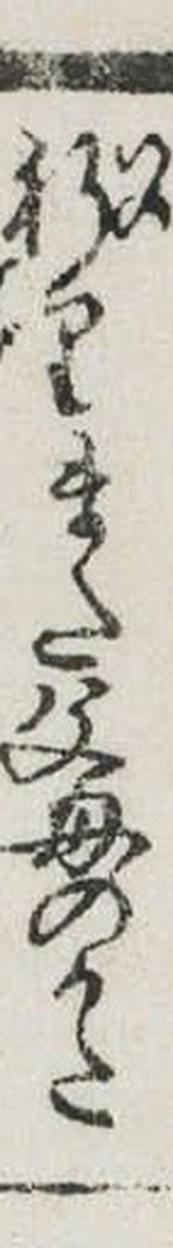祈りまた父母のかた
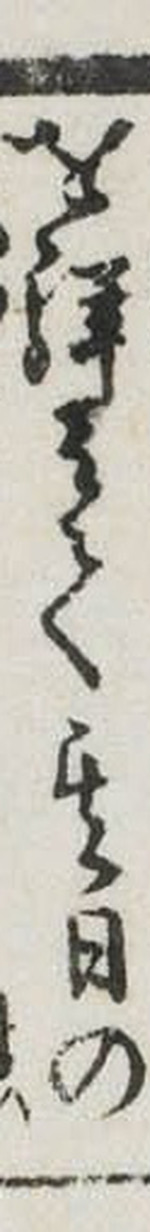を拝みて其日の
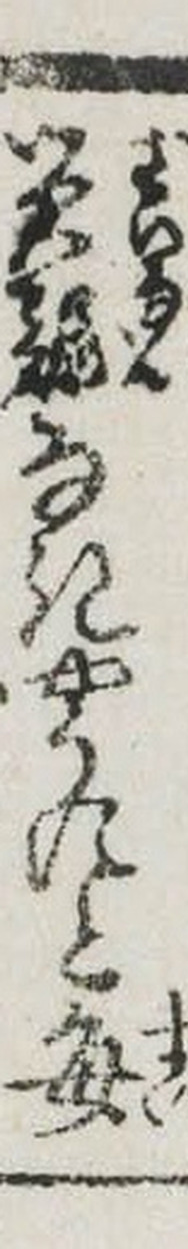災難なきやうにと毎
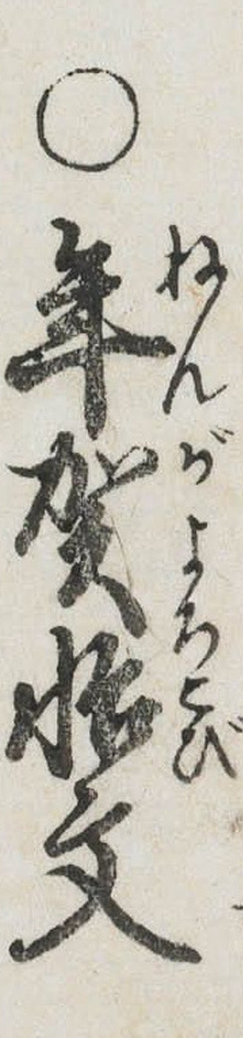○年賀怡文
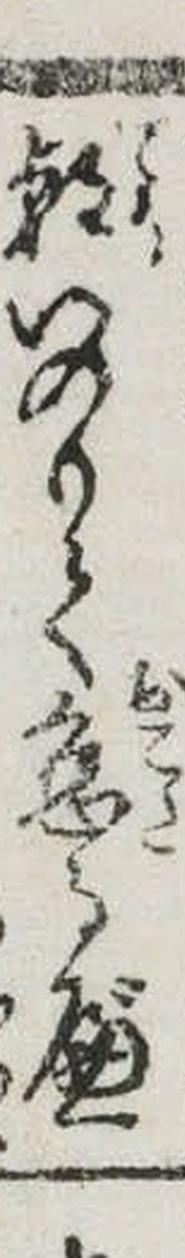朝いのりて怠るべ
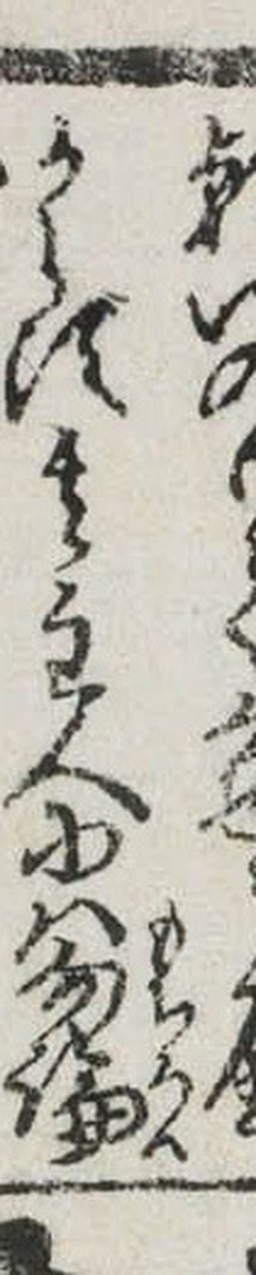からず其主人には勿論
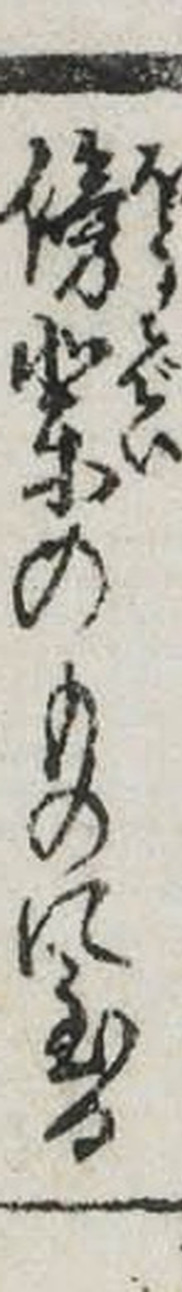傍輩のものに至る
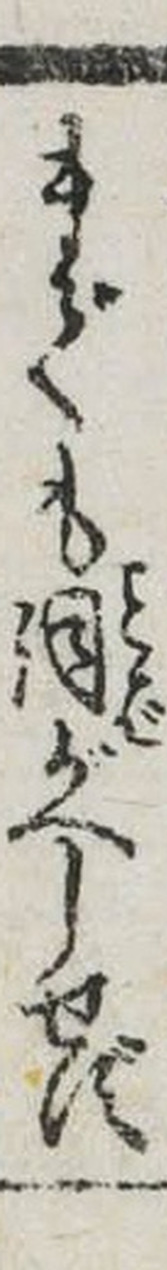までも詞がへしせず
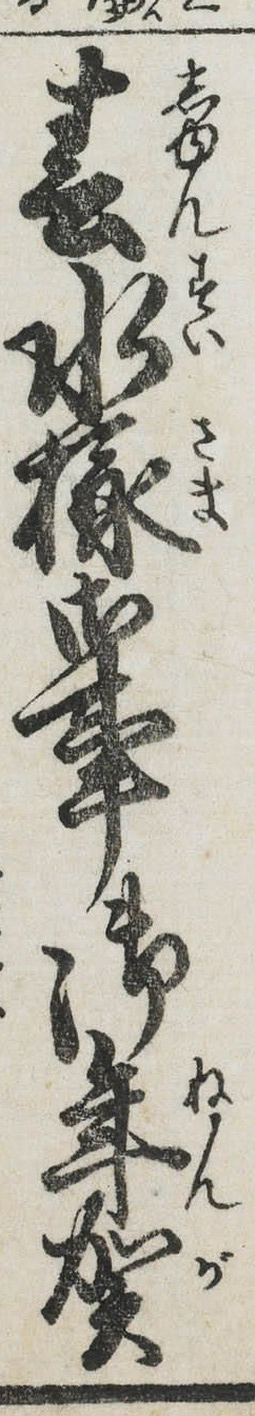春水様御事御年賀
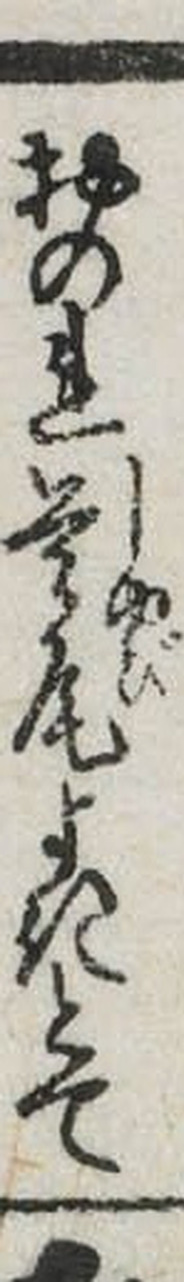おのれ首尾よきとて
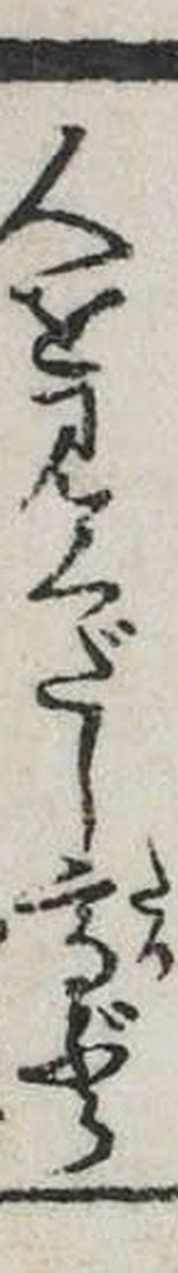人を見くだし高ぶら
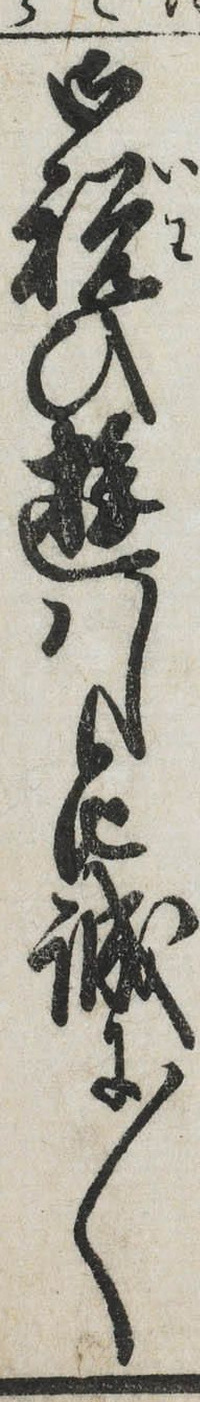御祝ひ遊はし候由誠に〳〵
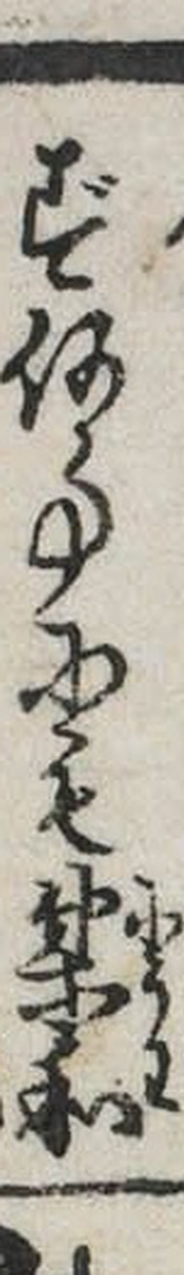ず何事にも柔和
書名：頭書萬用婦人手紙之文言
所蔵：東京学芸大学教育コンテンツアーカイブ
